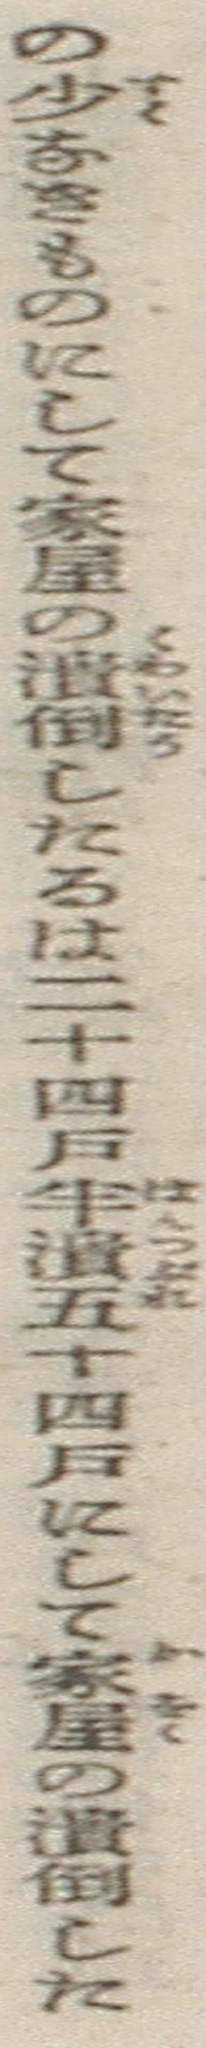の少なきものにして家屋の潰倒したるは二十四戸半潰五十四戸にして家屋の潰倒した
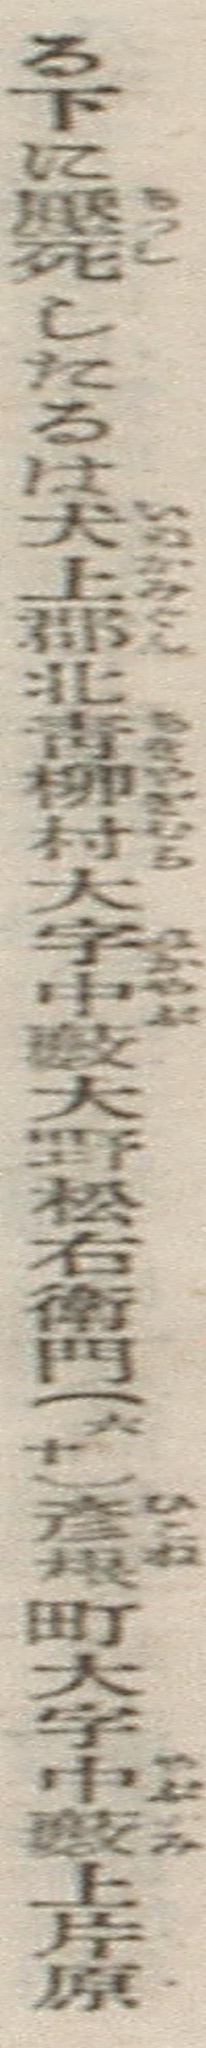る下に壓死したるは犬上郡北青柳村大字中藪大野松右衛門彦根町大字中藪上片原
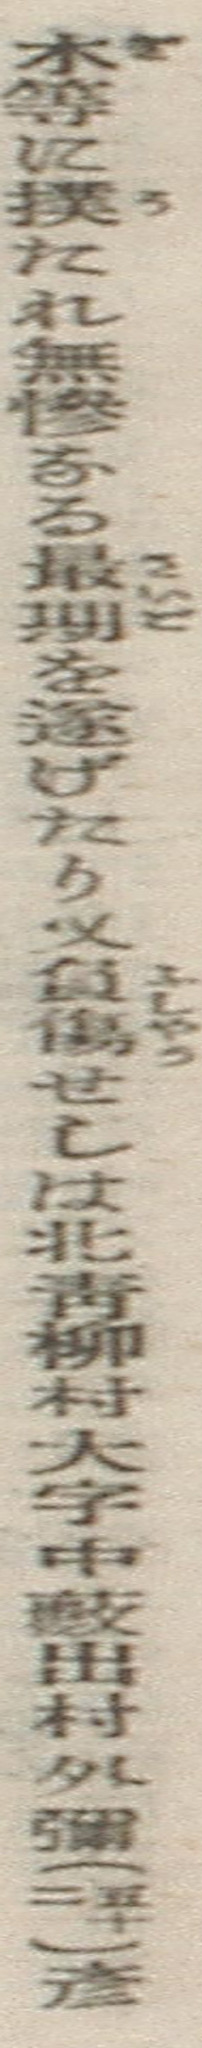木等に撲たれ無惨なる最後を遂げたり又負傷せしは北青柳村大字中藪出村外彌彦
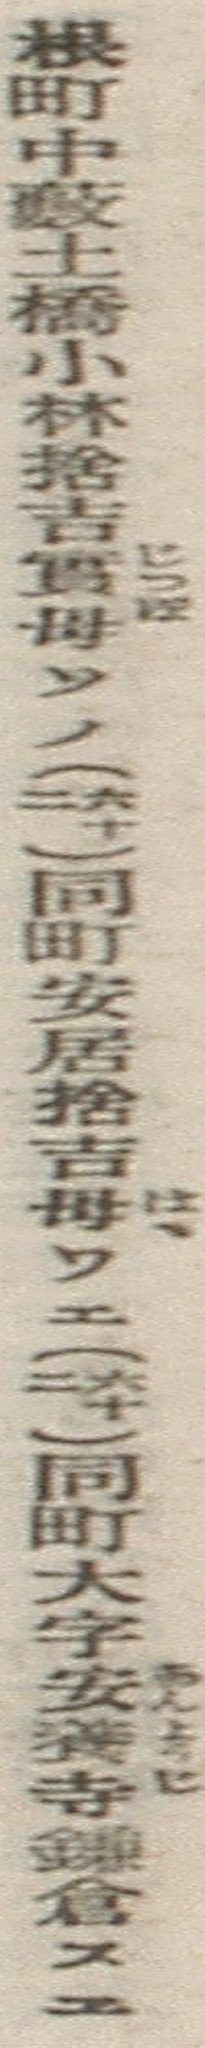根町中藪土橋小林捨吉實母ソノ同町安居捨吉母ワエ同町大字安養寺鎌倉スエ

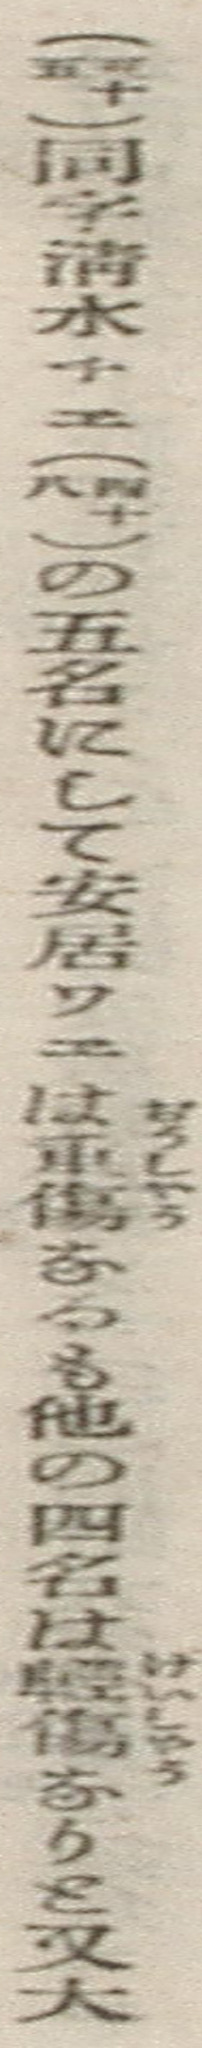同字清水チエの五名にして安居ワエは重症なるも他の四名は輕傷なりと又大
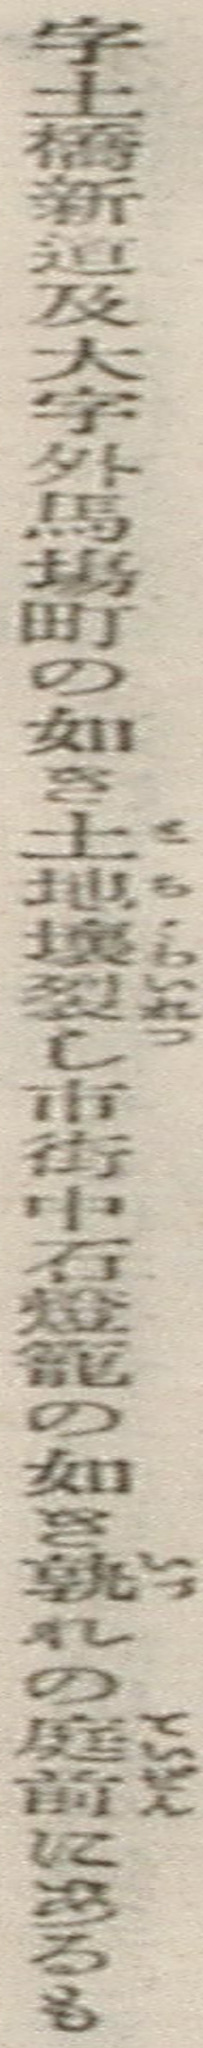字土橋新道及大字外馬場町の如き土地毀烈し市街中石燈籠の如き孰れの庭前にあるも
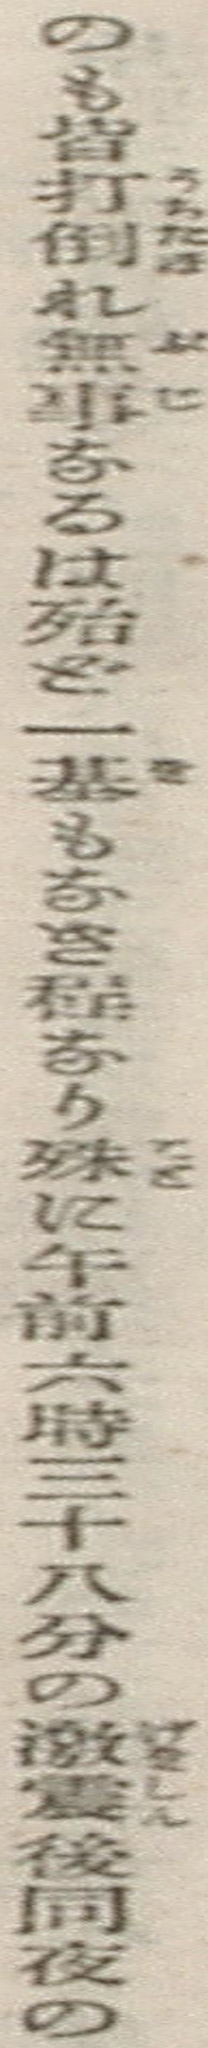のも皆打倒れ無事なるは殆ど一基もなき程なり殊に午前六時三十八分の激震後同夜の
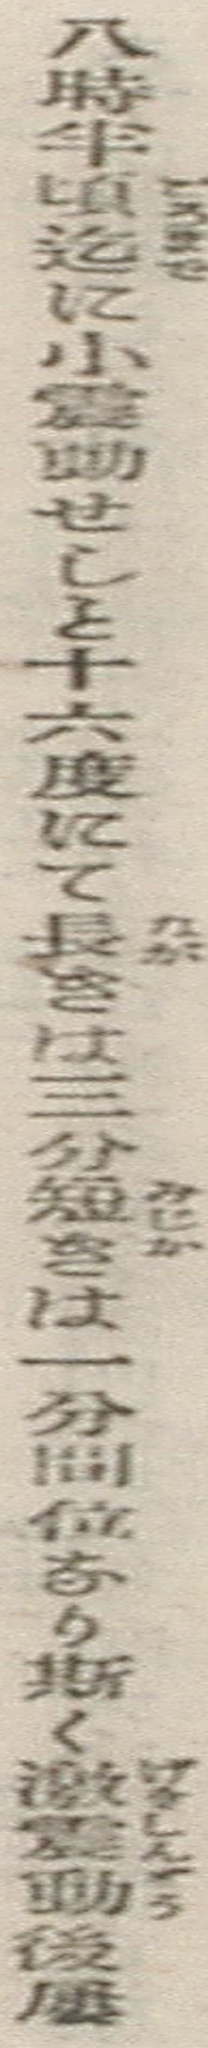八時半頃迄に小震動せしこと十六度にて長きは三分短きは一分間位なり斯く激震動後屡
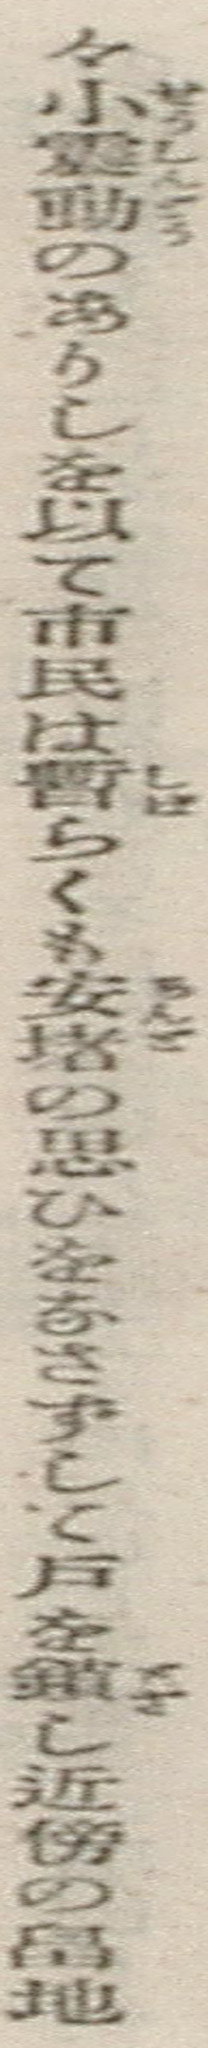々小震動のありしを以て市民は暫らく安堵の思ひをなさずして戸を鎖し近傍の畠地
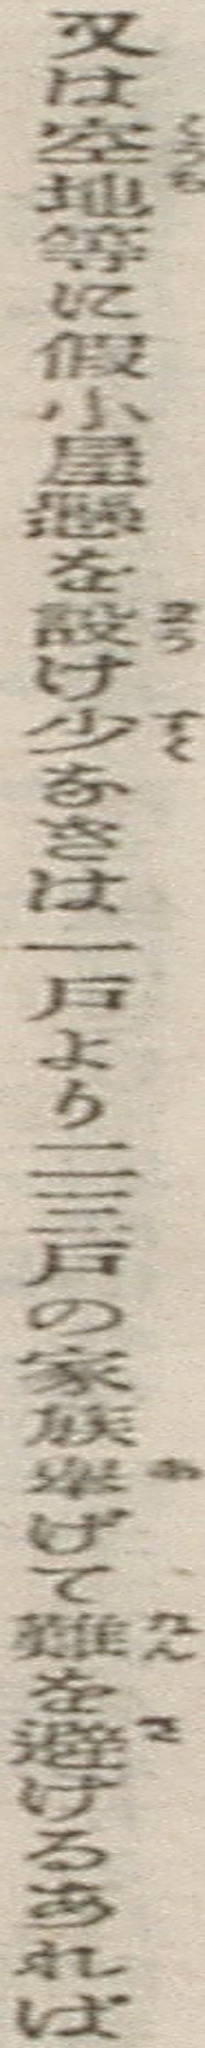又は空地等に假小屋懸を設け少なきは一戸より二三戸の家族挙げて難を避けるあれば
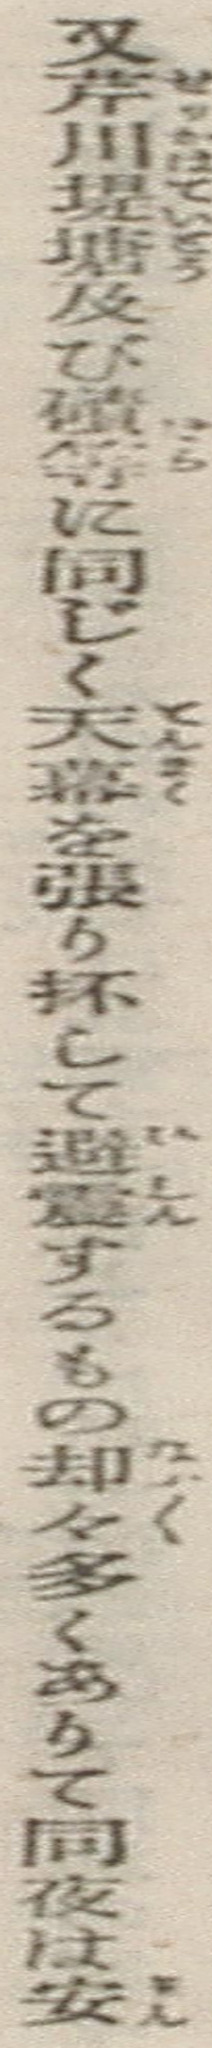又芹川堤塘及び磧等に同じく天幕を張り抔して避震するもの却々多くありて同夜は安
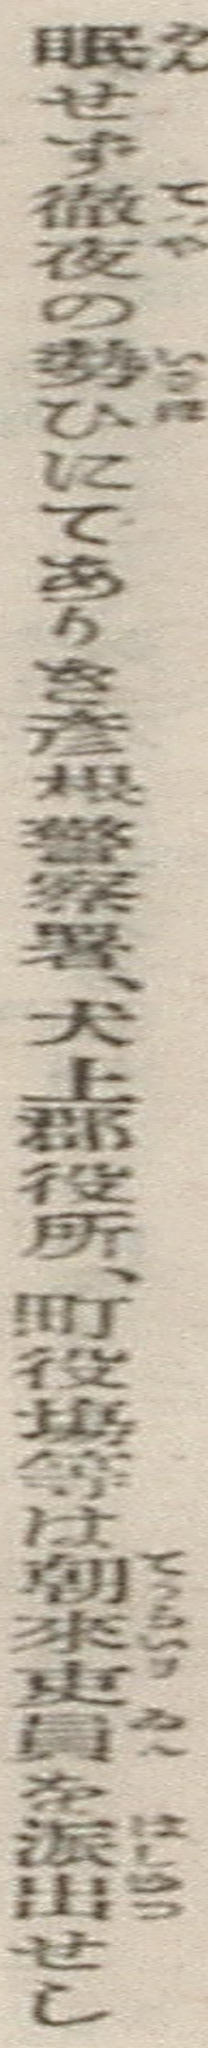眠せず徹夜の勢ひにてありき彦根警察署、犬上郡役所、町役場等は朝來吏員を派出せし
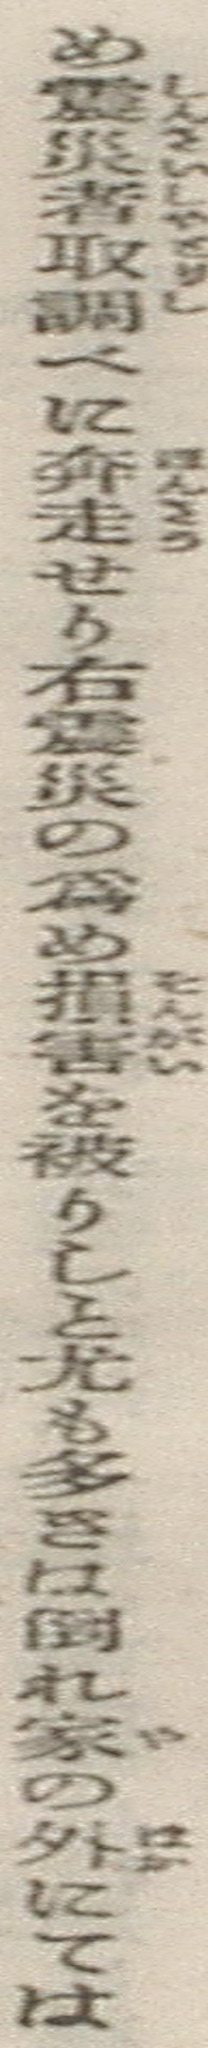め震災者取調べに奔走せり右震災の為め損害を被りしこと尤も多きは倒れ家の外にては
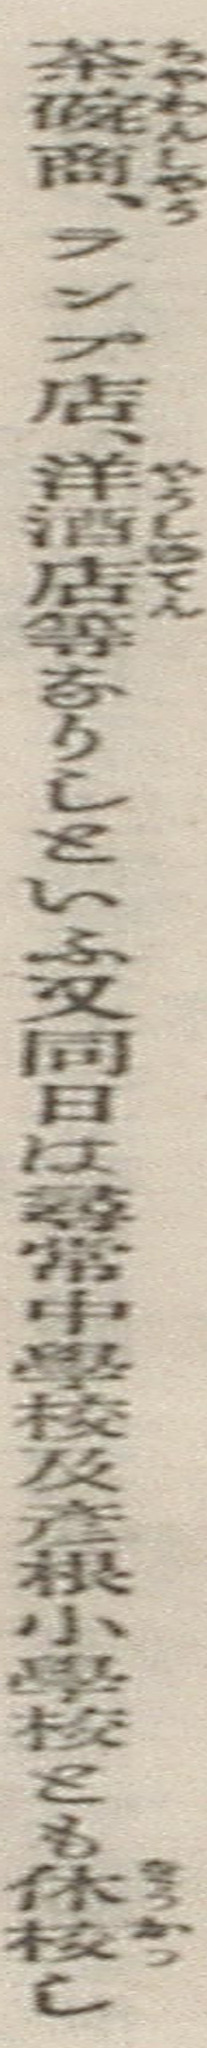茶碗商、ランプ店、洋酒店等なりしといふ又同日は尋常中學校及彦根小學校とも休校し
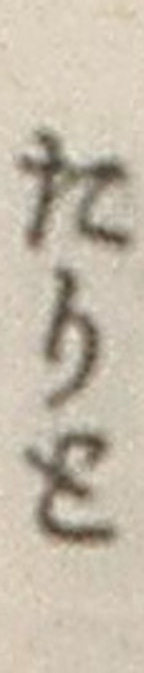たりと
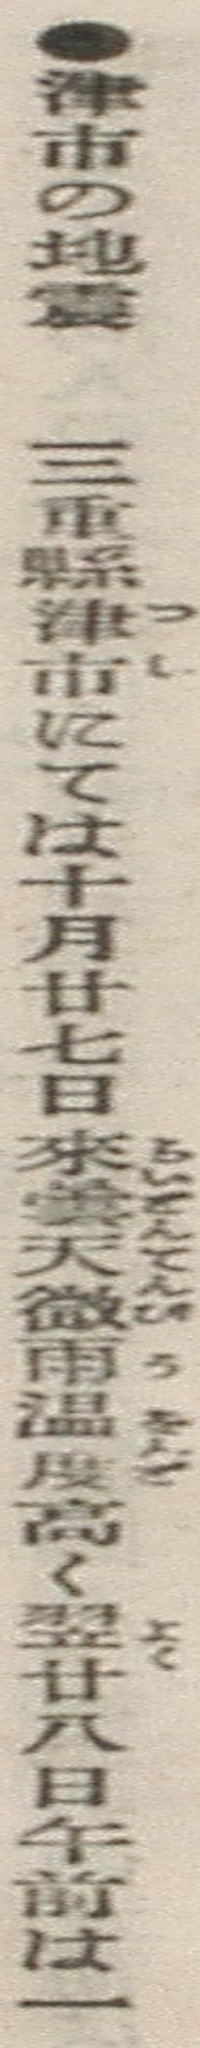●津市の地震三重縣津市にては十月廿七日來雲天微雨温度高く翌廿八日午前は一
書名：愛知岐阜福井三県　大地震見聞録（内題）
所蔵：東京大学地震研究所図書室 Earthquake Research Institute Library, The University of Tokyo, JAPAN
